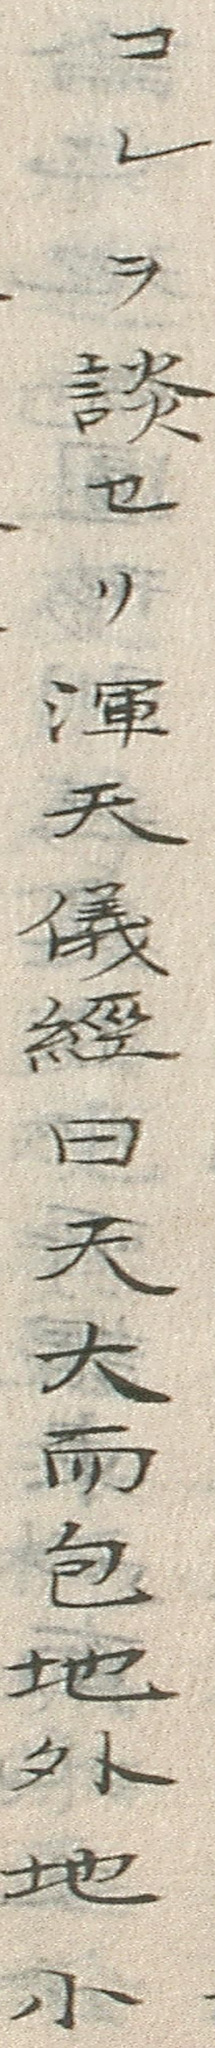コレヲ談セリ渾天儀経曰天大而包地外地小
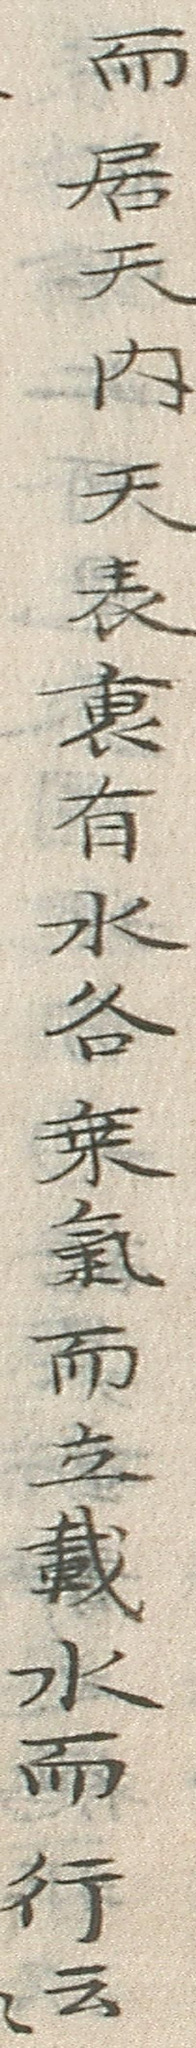而居天内天表裏有水各乗気而立載水而行云〻
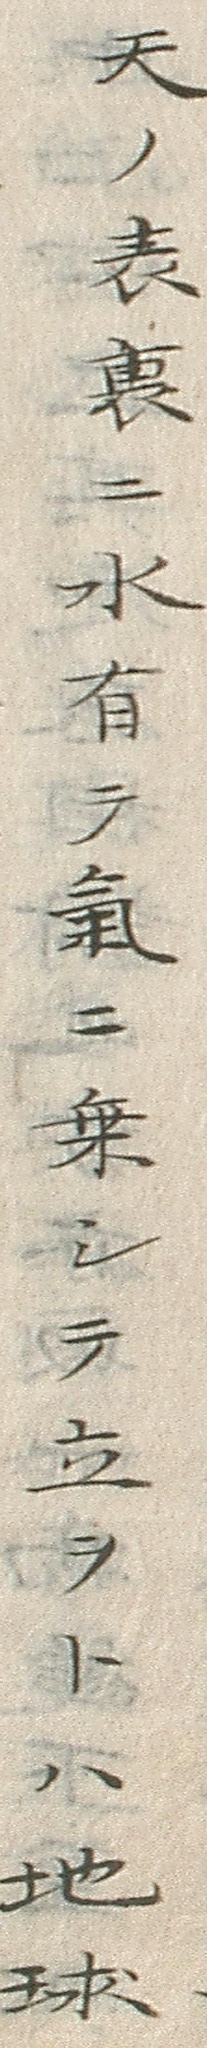天ノ表裏ニ水有テ気ニ乗シテ立ヲトハ地球
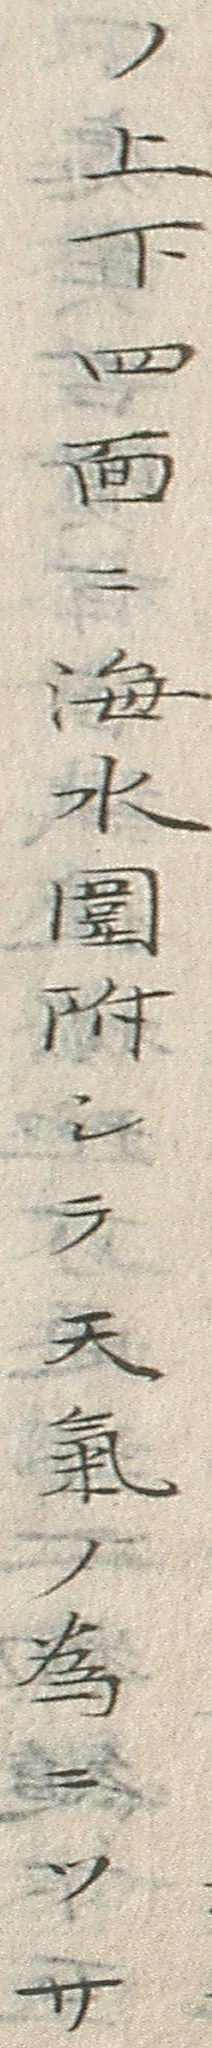ノ上下四面ニ海水図付シラ天気ノ為ニッサ
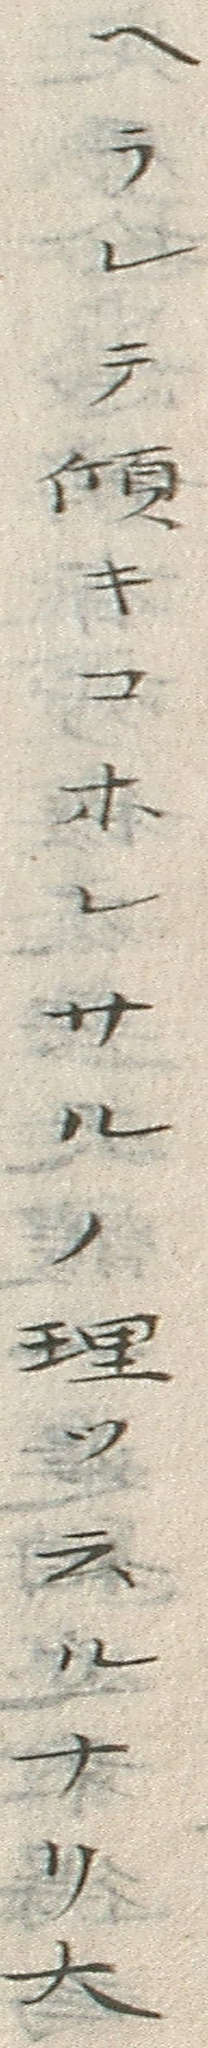ヘラレテ傾キコホレサルノ理ソ云ルナリ大
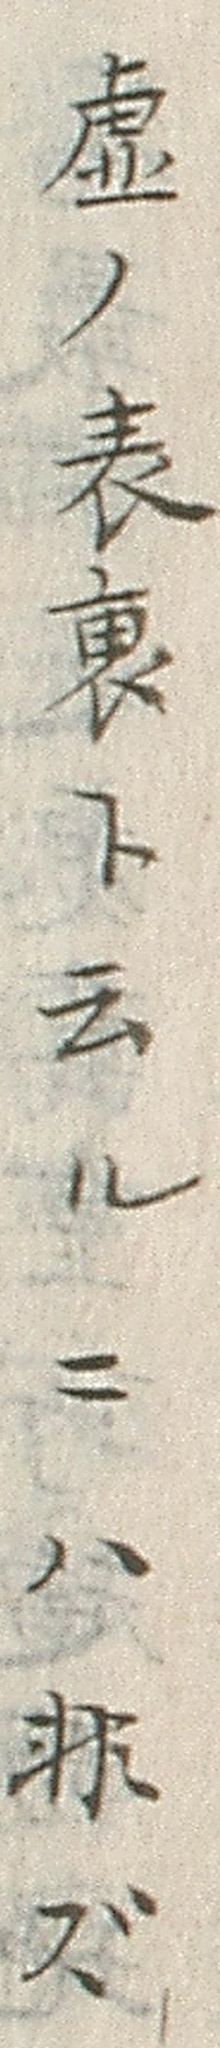虚ノ表裏ト云ルニハ非ズ

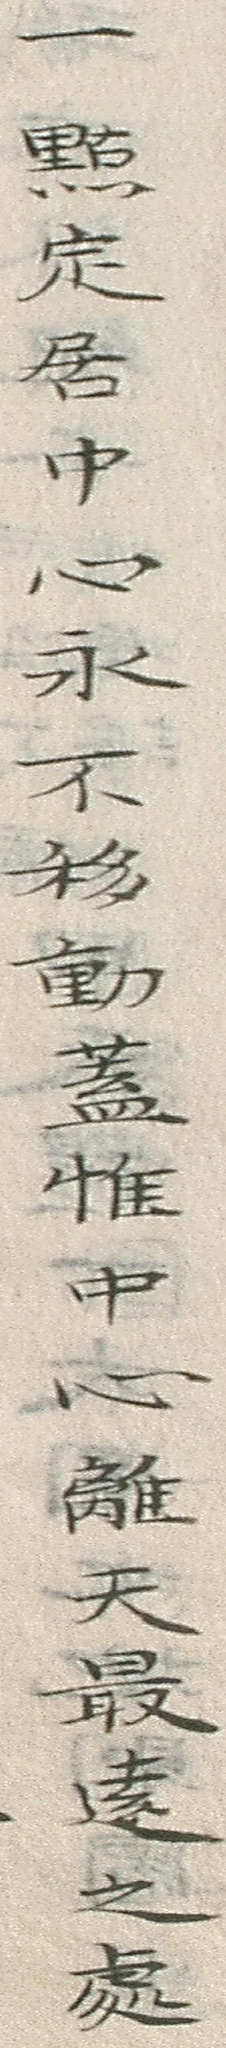一点定居中心永不移動蓋惟中心離天最遠之処
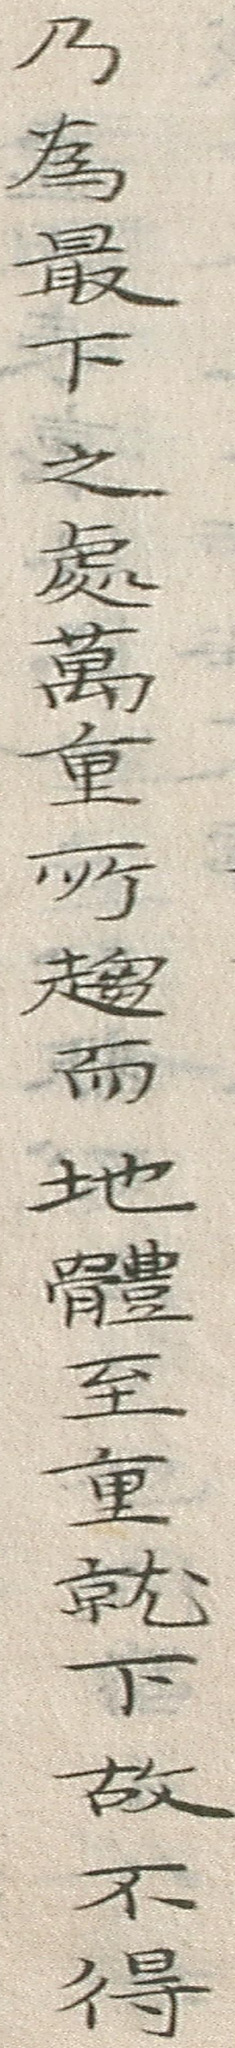乃為最下之処万重所趨而地体至重就下故不得
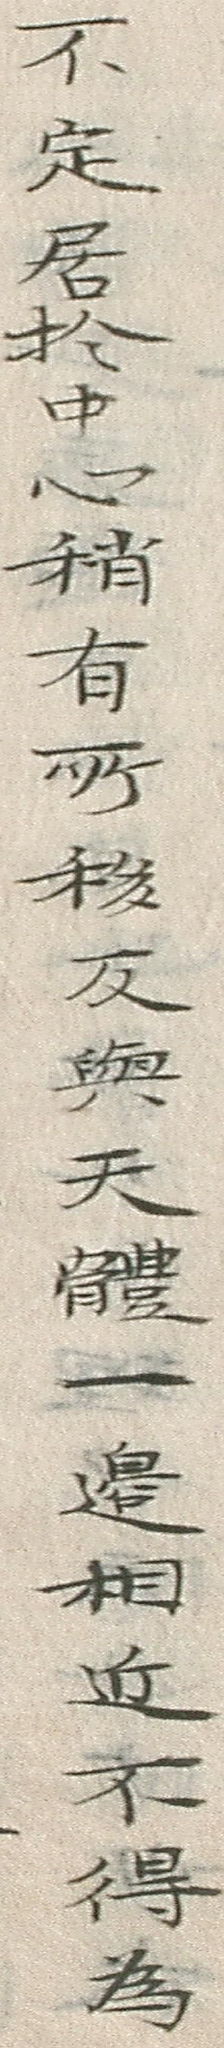不定居於中心稍有所反与天体一辺相近不得為
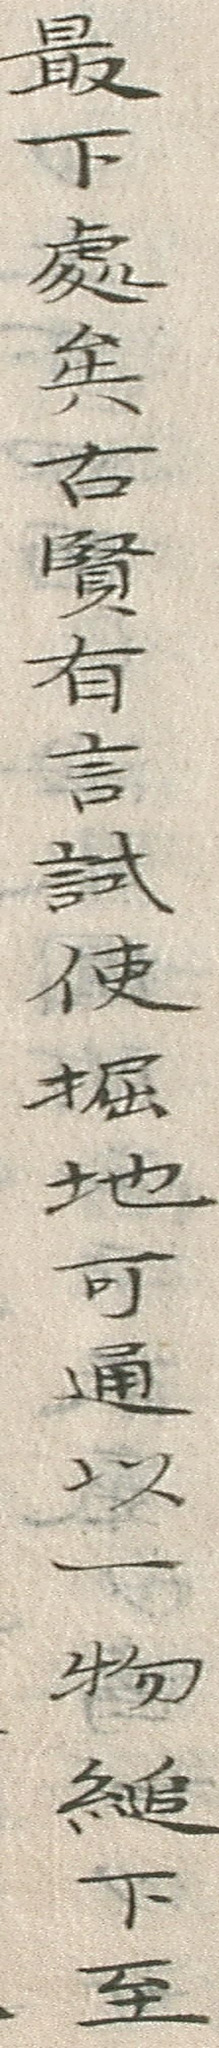最下処矣古賢有言試使掘地可通以一物縋下至
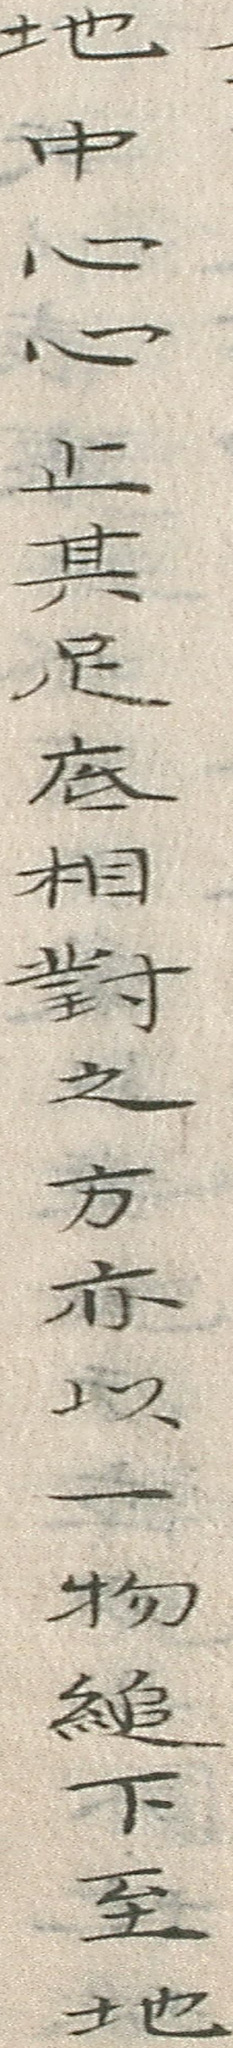地中心心止其足底相対之方亦以一物縋下至地
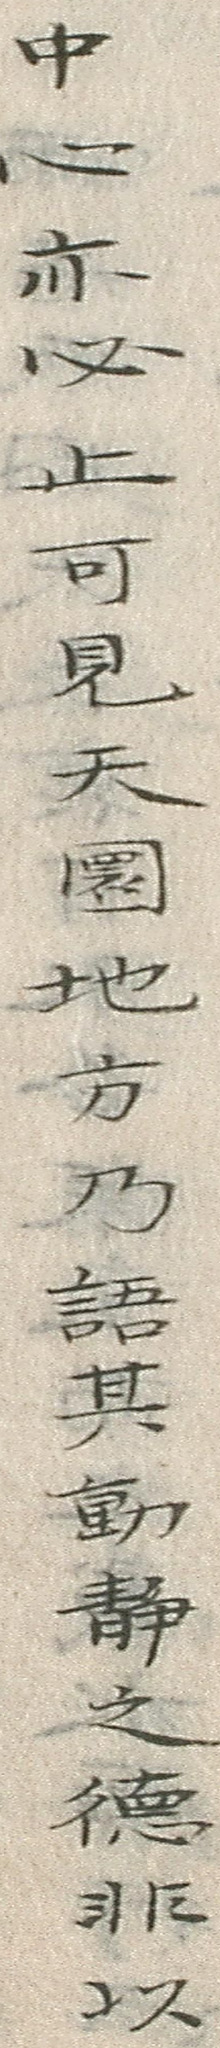中心亦必止可見天円地方乃語其動静之徳非以
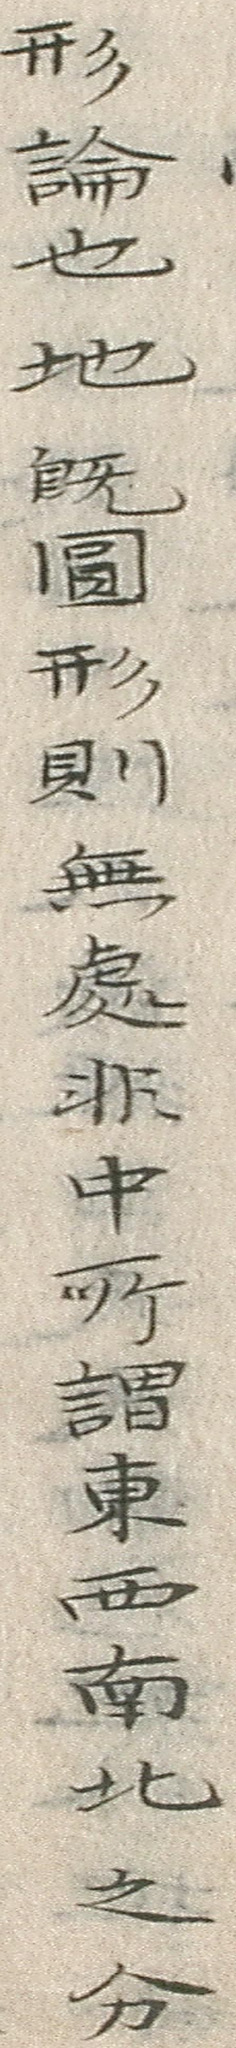形論也地既円形則無処非中所謂東西南北之分
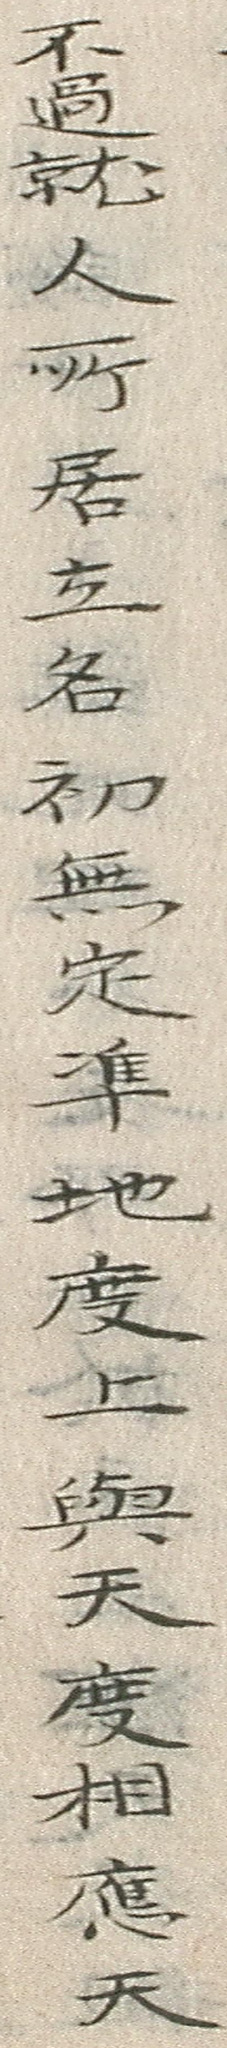不過就人所居立各初無定準地度上与天度相応天
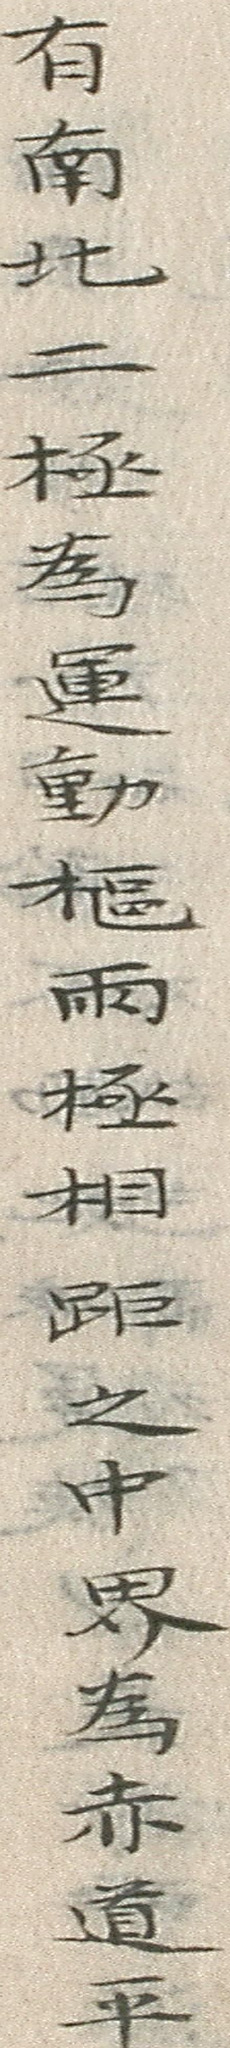有南北二極為運動枢両極相距之中界為赤道平
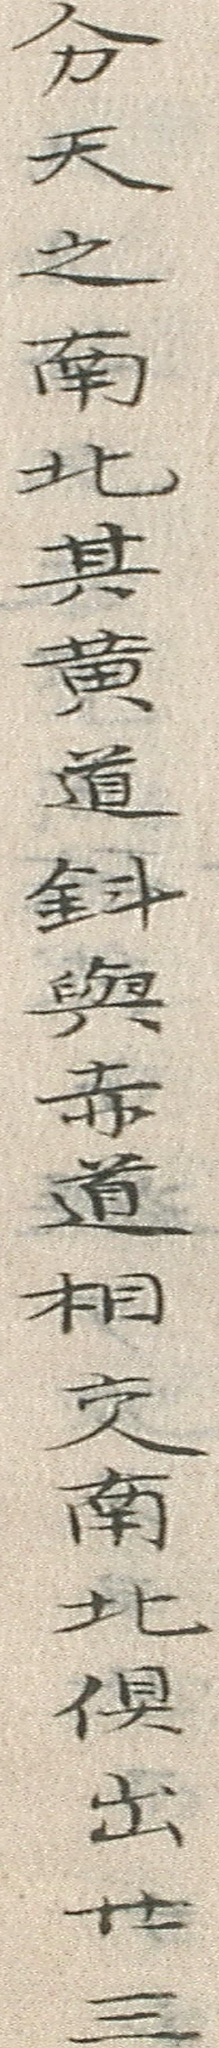分天之南北其黄道斜与赤道相交南北俱出廿三
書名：天學略名目羽翼　全
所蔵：東京大学地震研究所図書室 Earthquake Research Institute Library, The University of Tokyo, JAPAN
